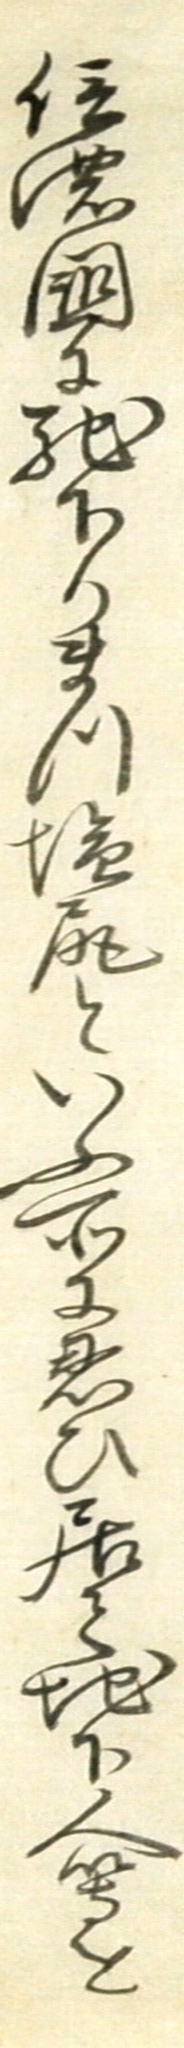信濃国に馳下りまつ塩尻といふ所に忍ひ居て地下人等を
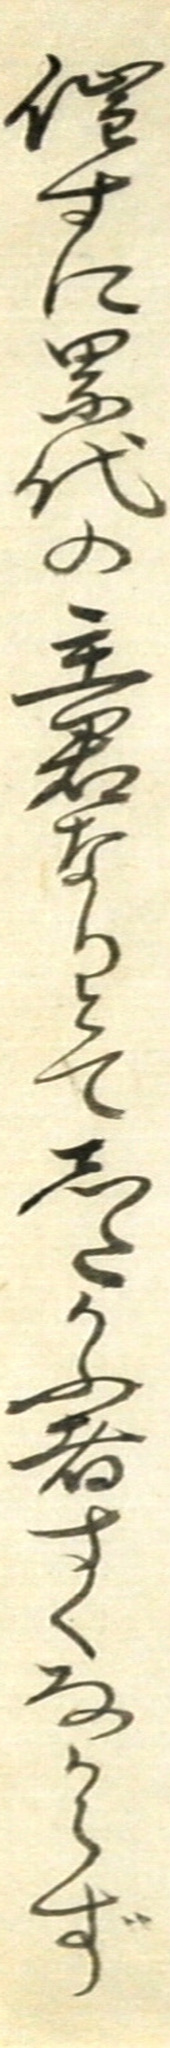催すに累代の主君なりとてしたかふ者すくなからず
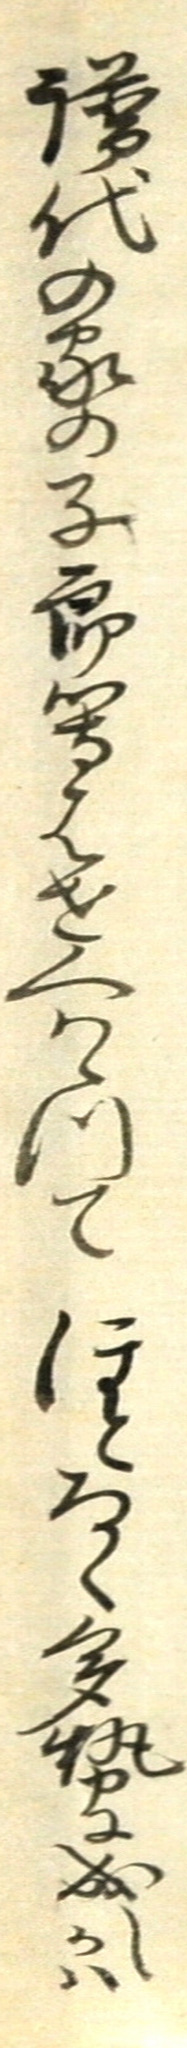譜代の家の子郎等はせくはゝつてほとなく多勢に成しかは

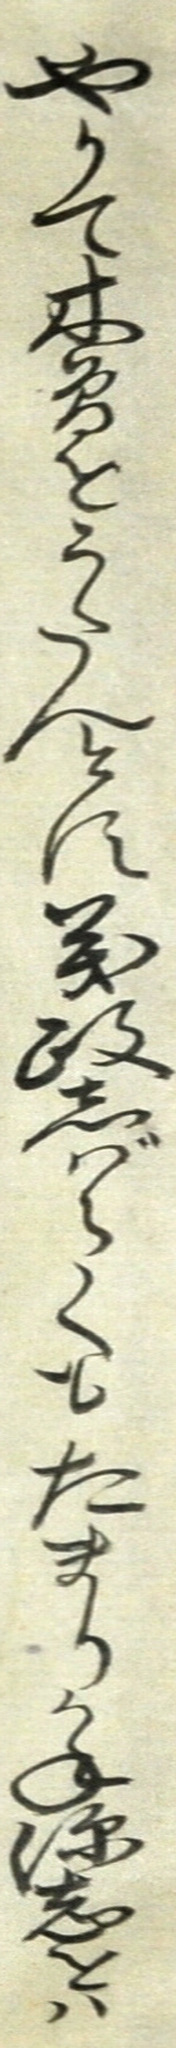やかて木曽をうたんとす義政しばらくもたまりかね深志をは
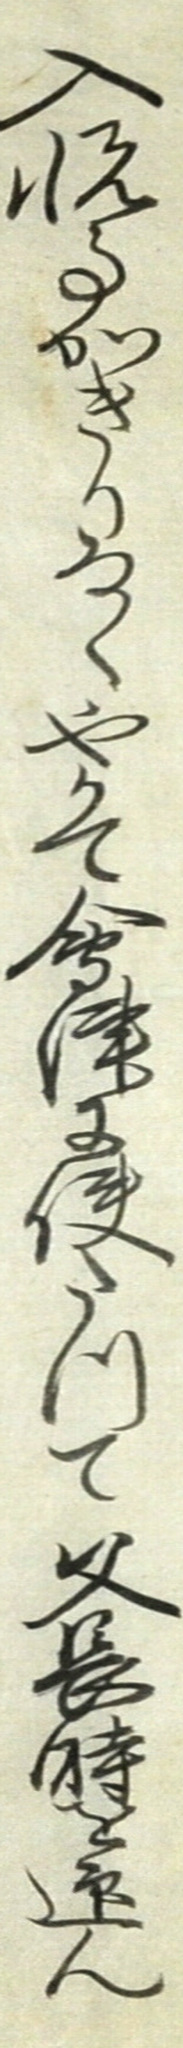入悦事かきりなくやかて会津に使たつて父長時を迎ん
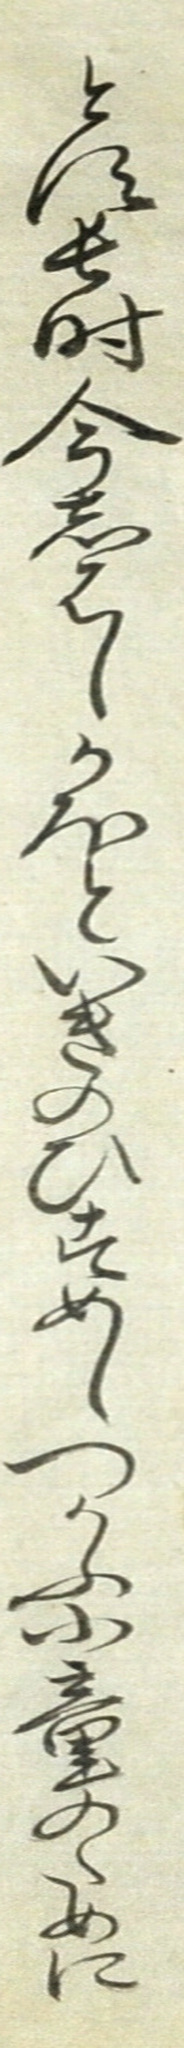とす長時今しはしかほといきのひすめしつかふ小童のために
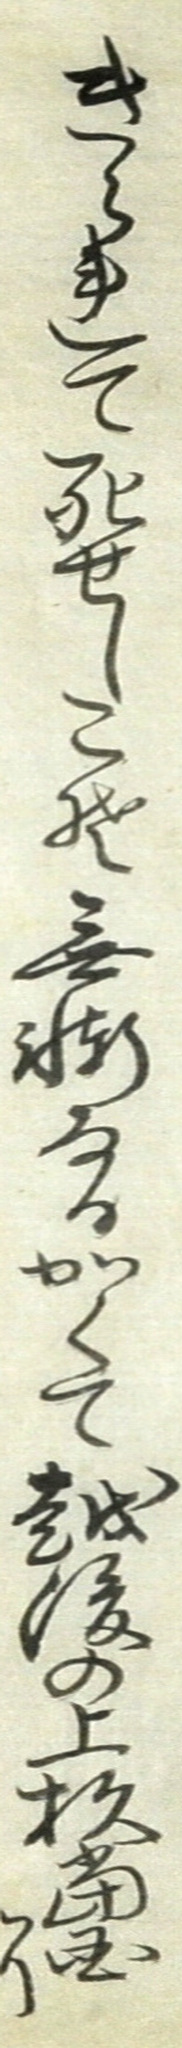きられて死せしこそ無慚なるかくて越後の上杉当国に
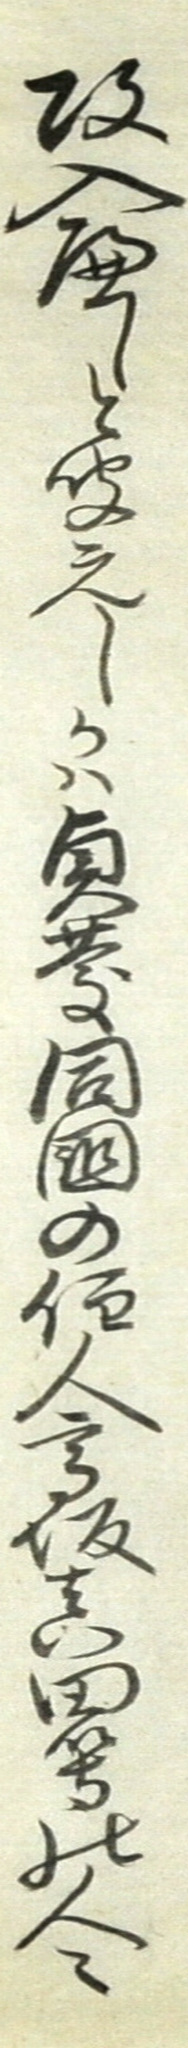攻入りへしと聞えしかは貞慶同国の住人高坂真田等の人々
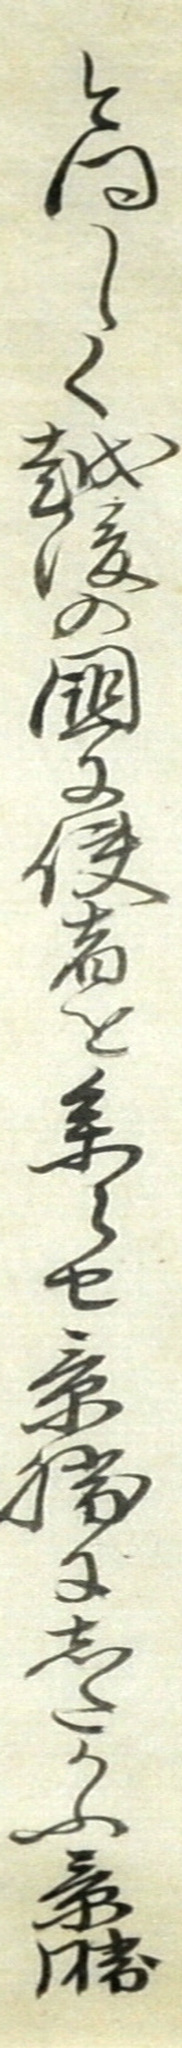と同しく越後の国に使者を参らせ景勝にしたかふ景勝
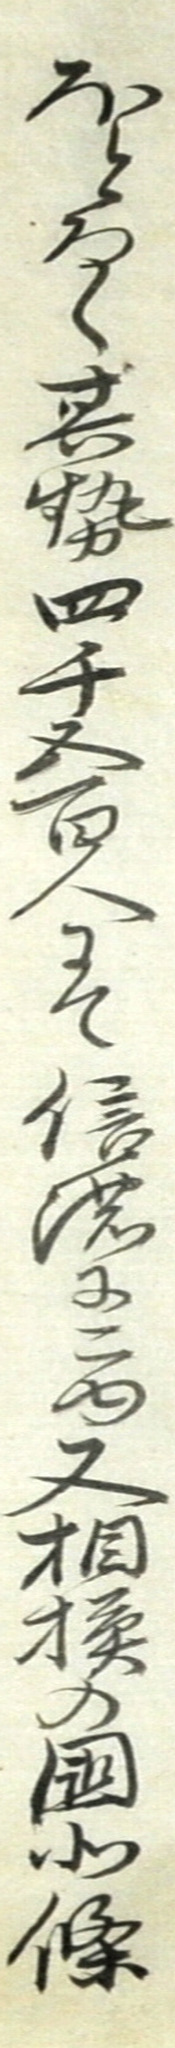ほとなく其勢四千五百人にて信濃にこゆ又相模の国北条
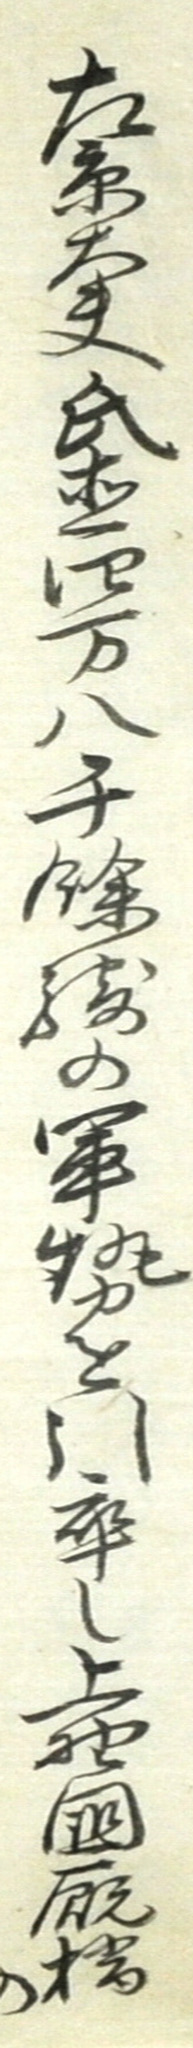左京大夫氏直四万八千余騎の軍勢を引率し上野国厩橋の
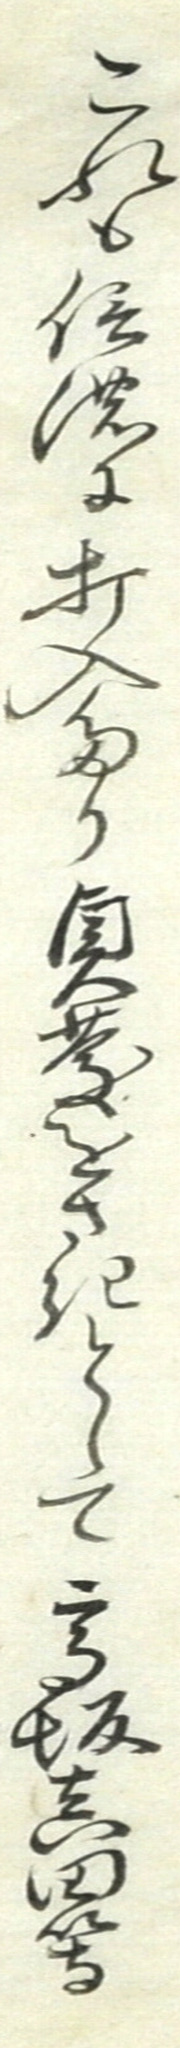これも信濃に打入たり貞慶をさきとして高坂真田等
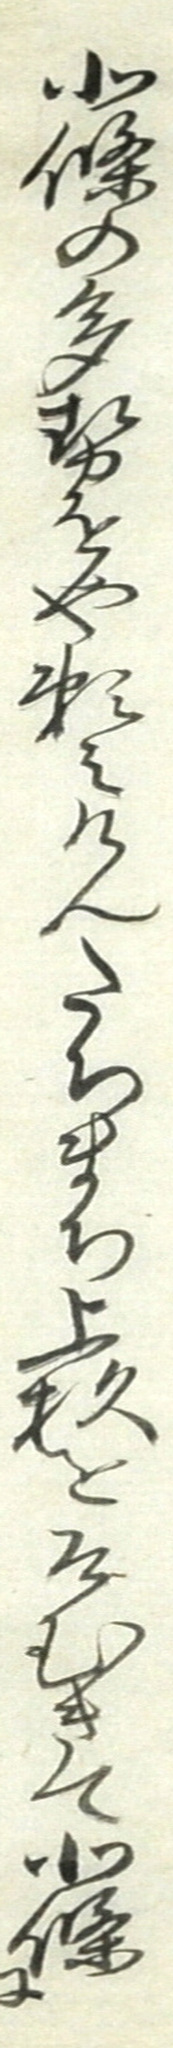北条の多勢をや頼みけんたちまち上杉をそむきて北条に
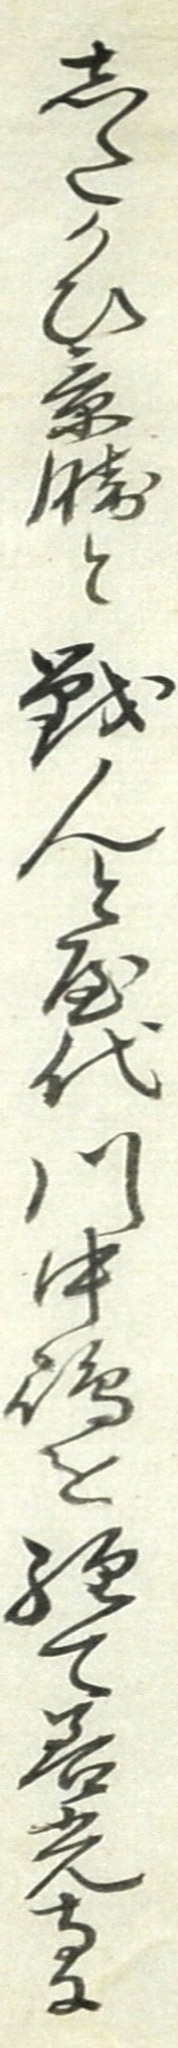したかひ景勝と戦んと屋代川中島を経て善光寺に
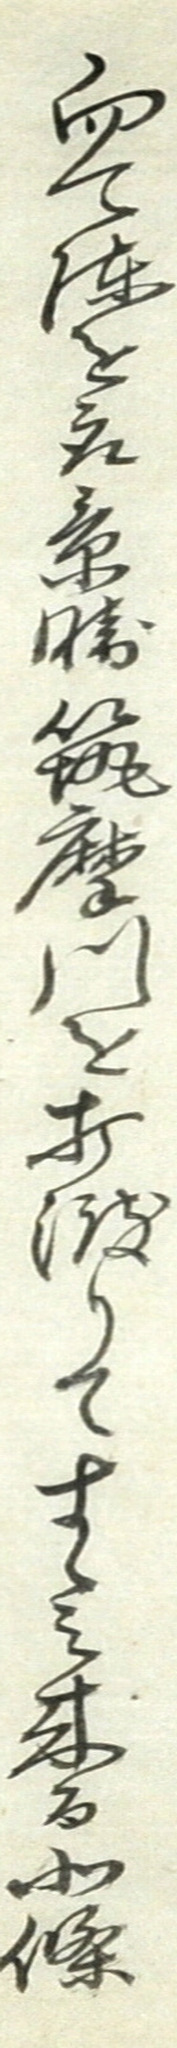向て陣を取景勝筑摩川を打渡りてすゝみ来る北条
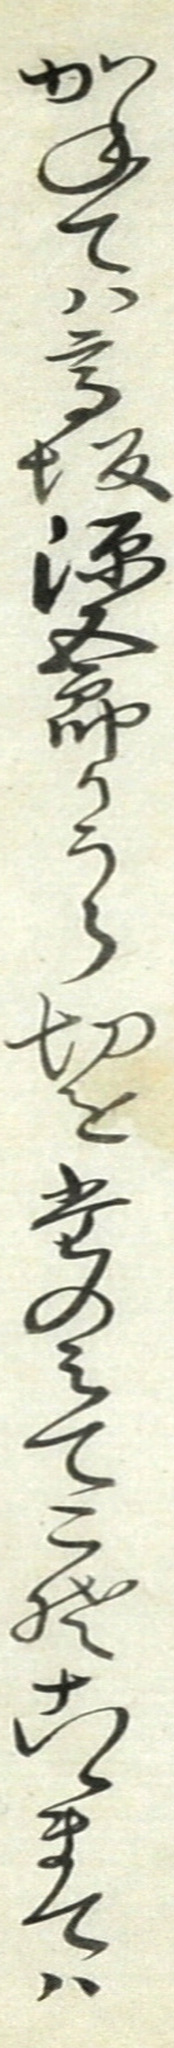かねては高坂源五郎かうら切をたのみてこそこゝまては
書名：藩翰譜（六）
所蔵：伊那市立高遠町図書館・合同会社AMANE
